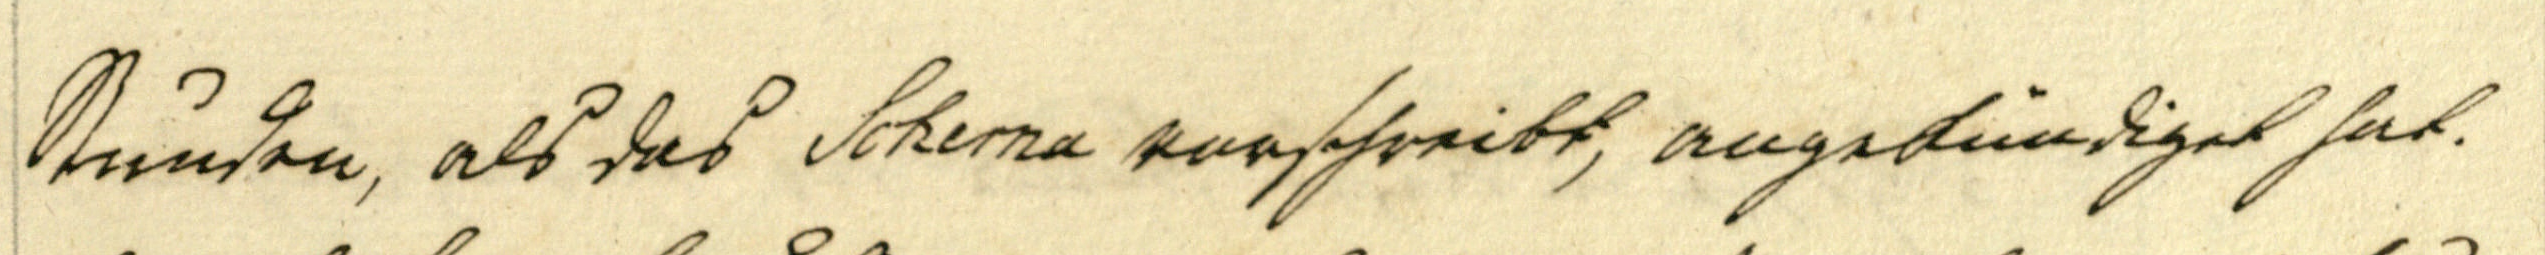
Stunden, als das Schema vorschreibt, angekündiget hat¬
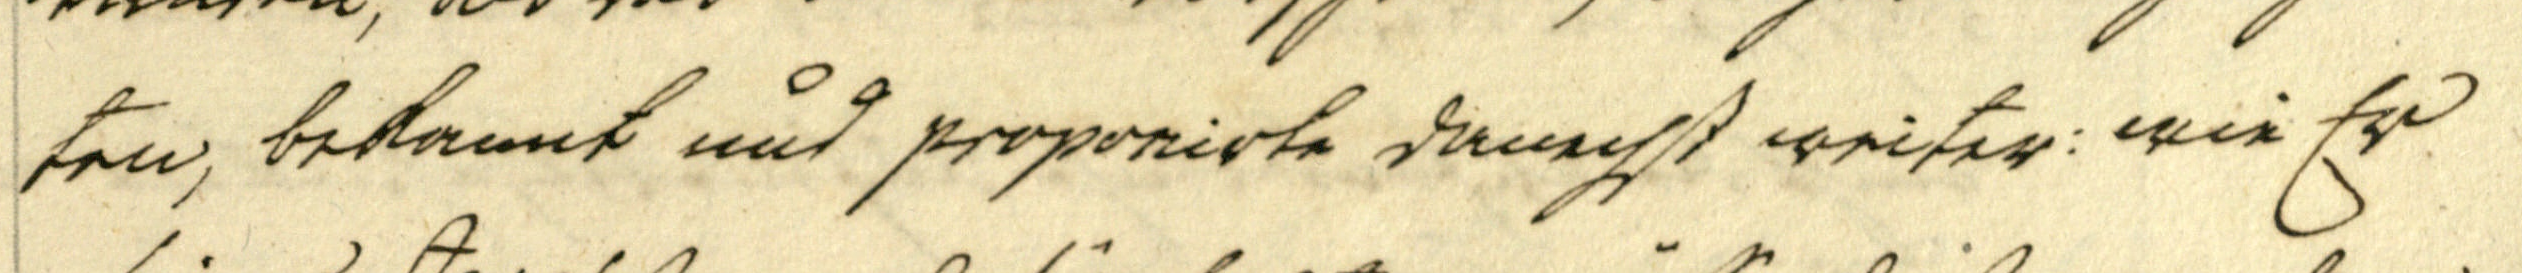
ten, bekannt und proponirte danechst weiter: wie Er
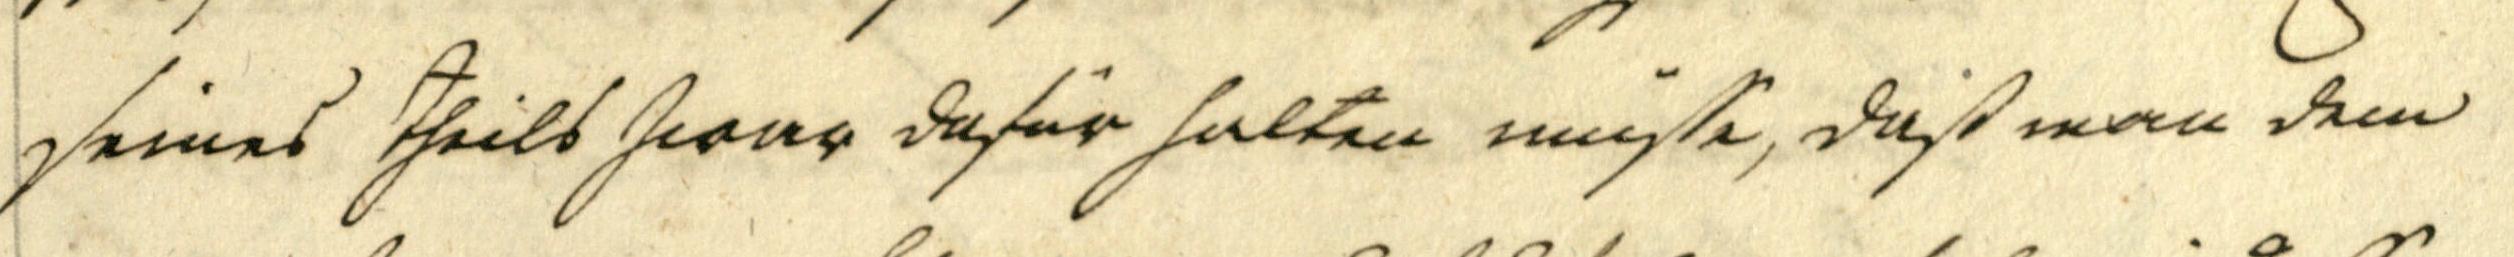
seines Theils zwar dafür halten müsse, daß man dem
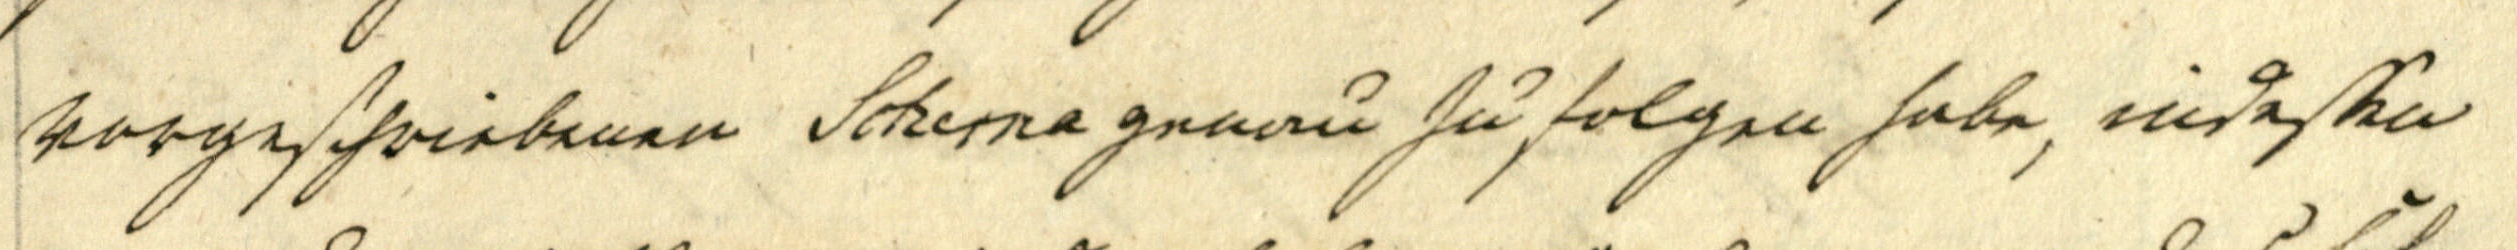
vorgeschriebenen Schema genau zu folgen habe, indessen
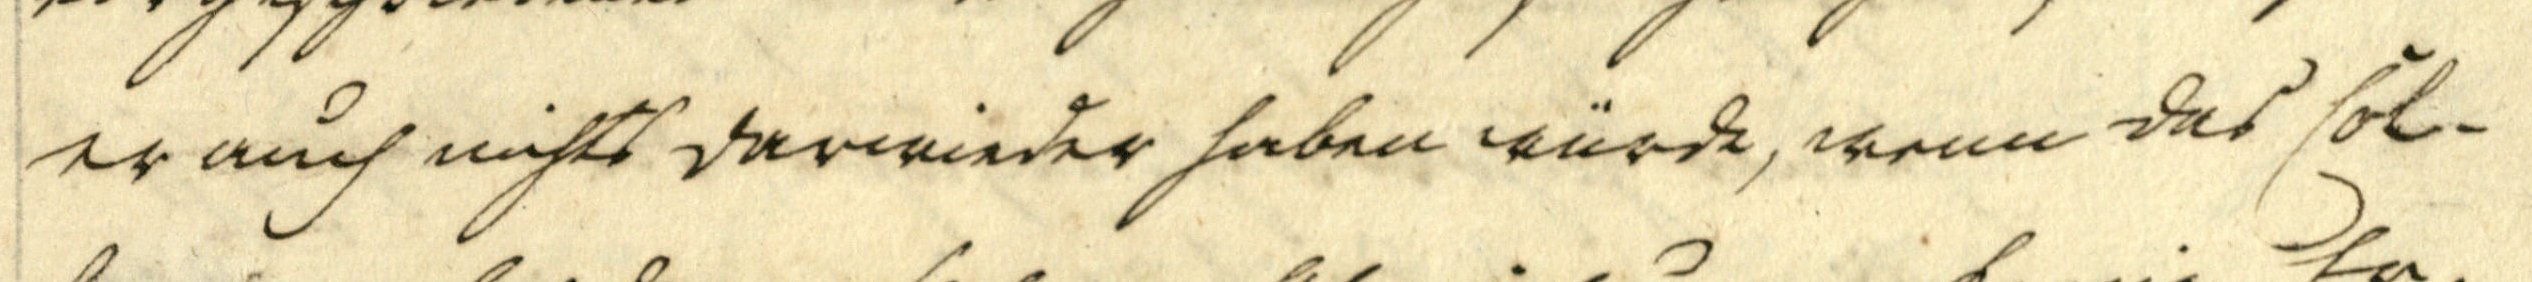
er auch nichts darwieder haben würde, wenn das Col¬
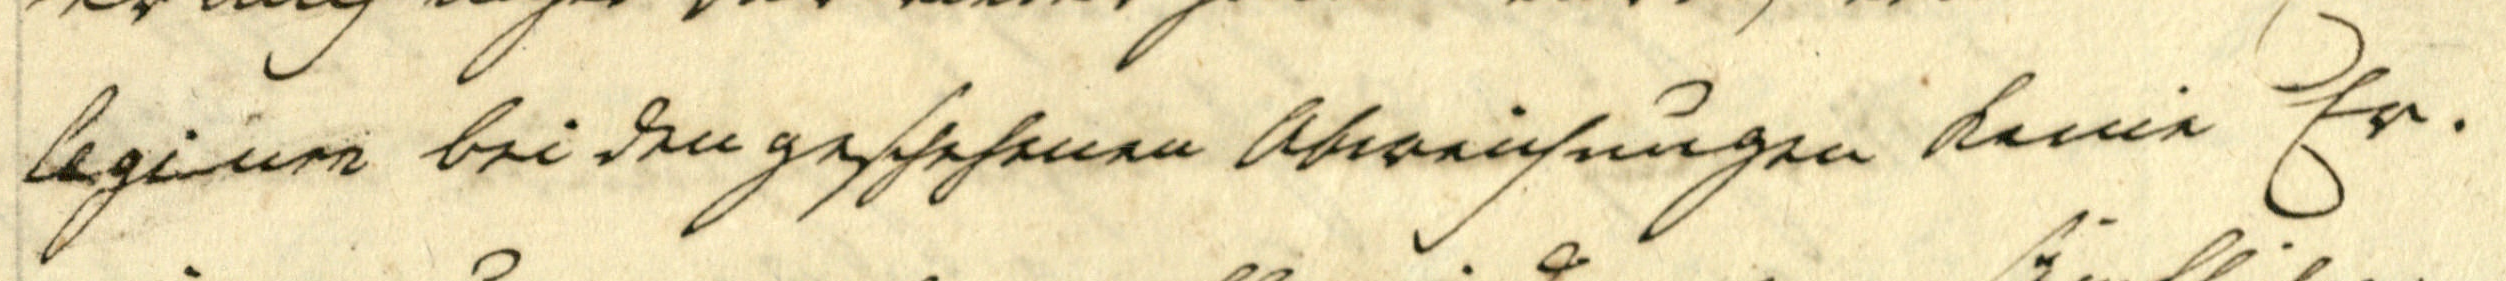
legium bei den geschehenen Abweichungen keine Er¬
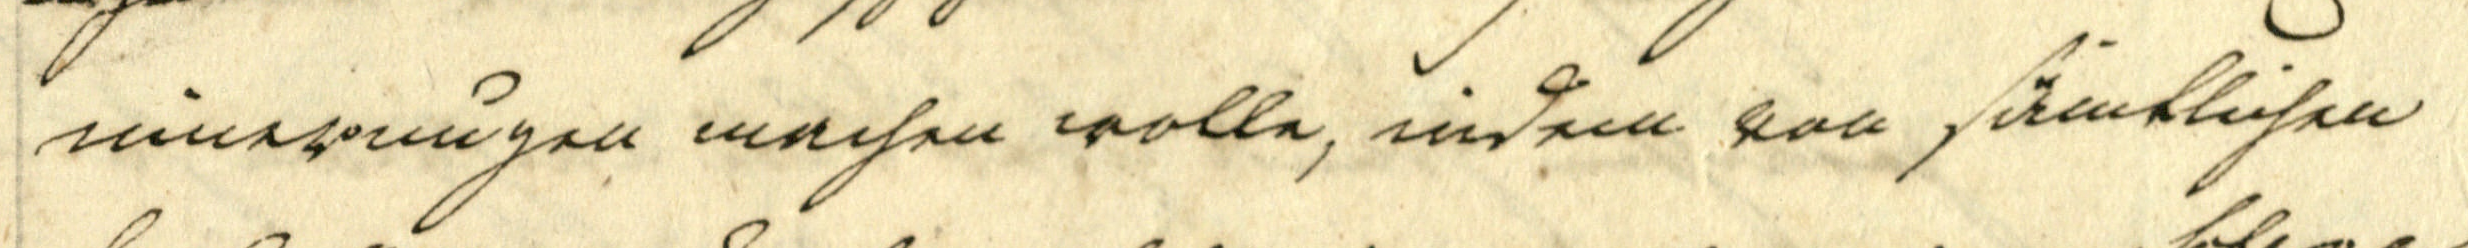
innerungen machen wolle, indem von sämtlichen
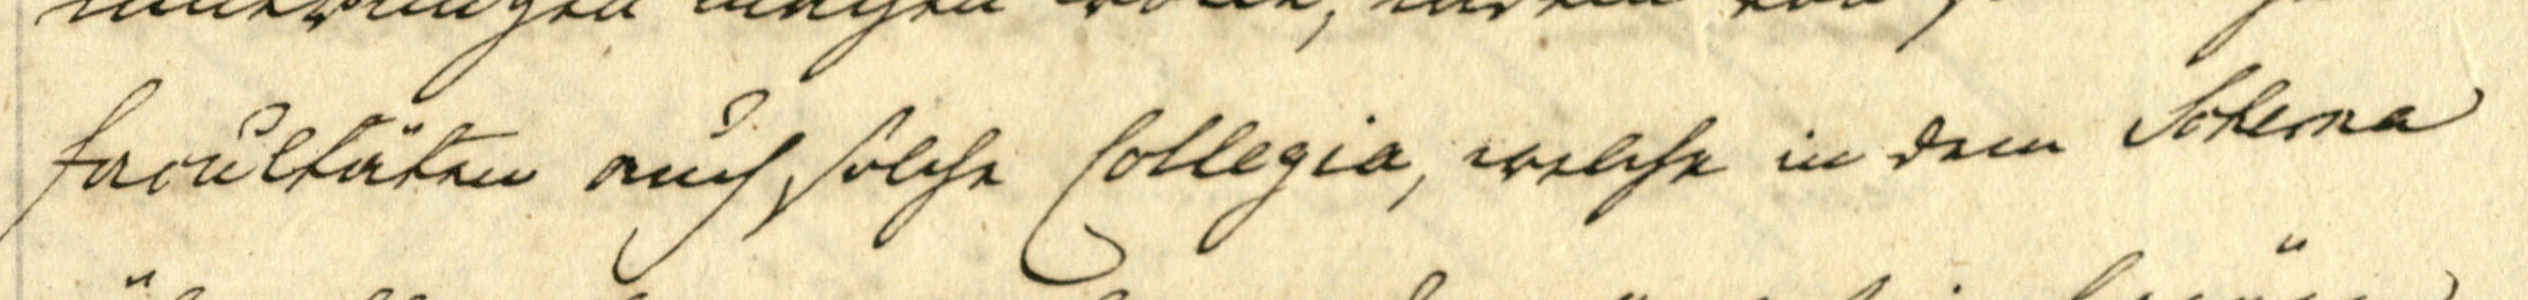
Facultäten auch solche Collegia, welche in dem Schema
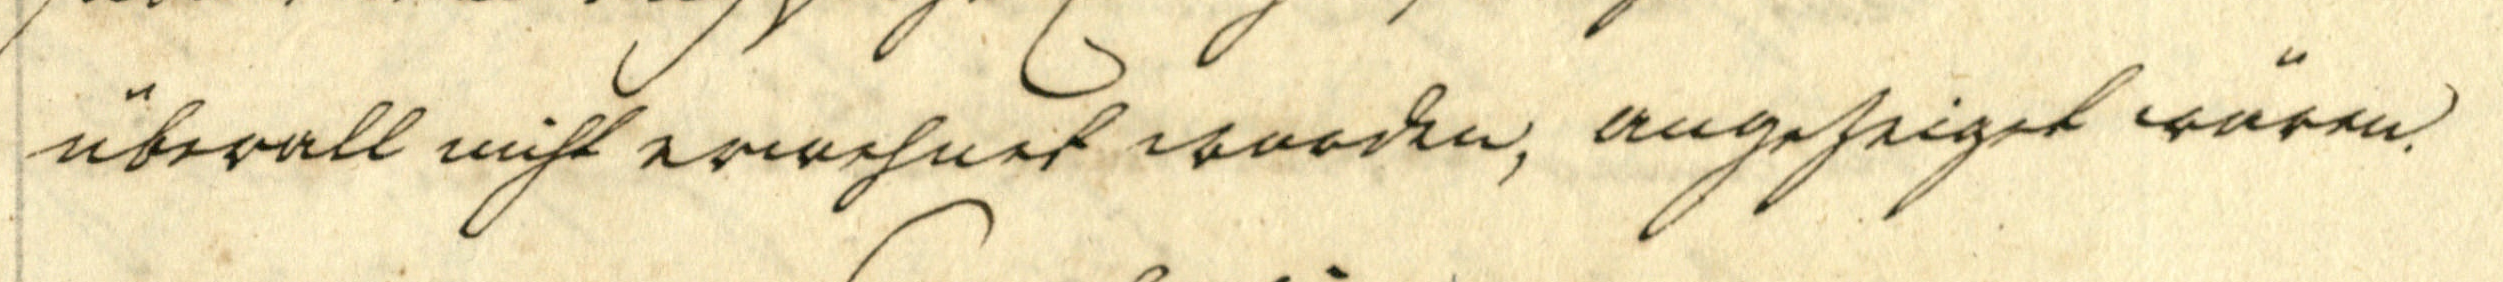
überall nicht erwehnet worden, angezeiget wären.
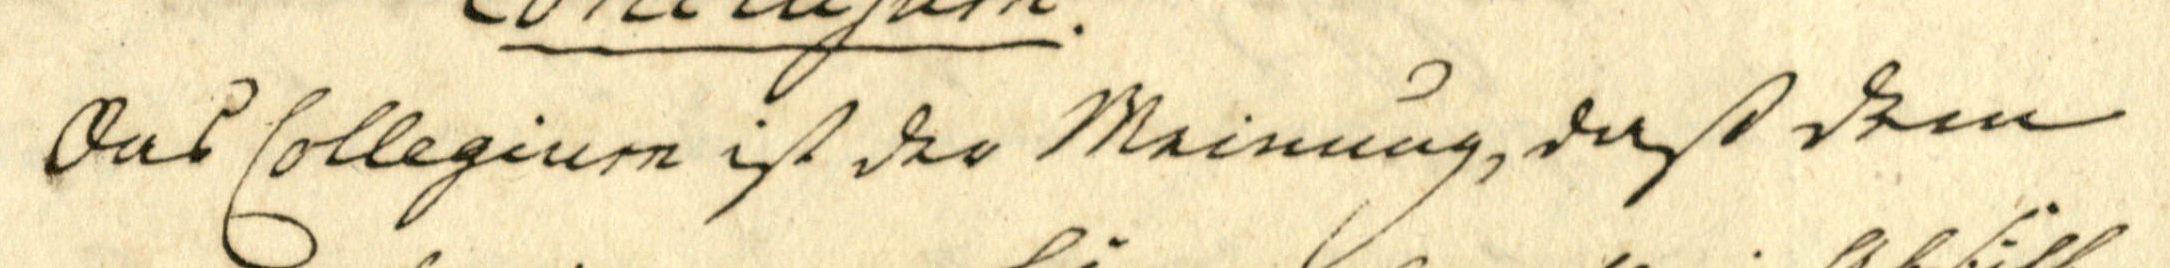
Das Collegium ist der Meinung, daß dem
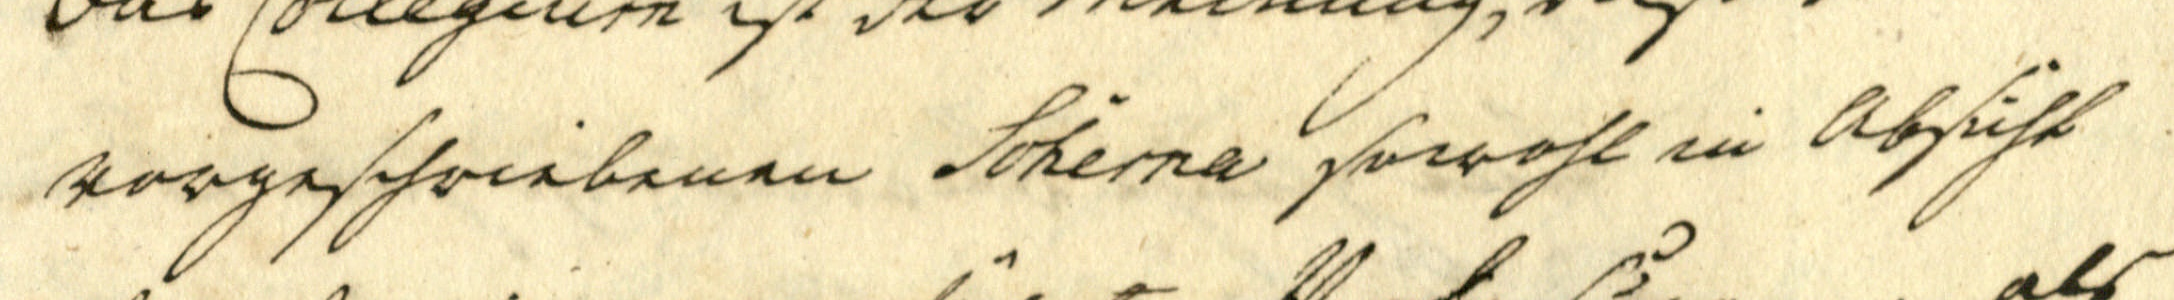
vorgeschriebenen Schema sowohl in Absicht
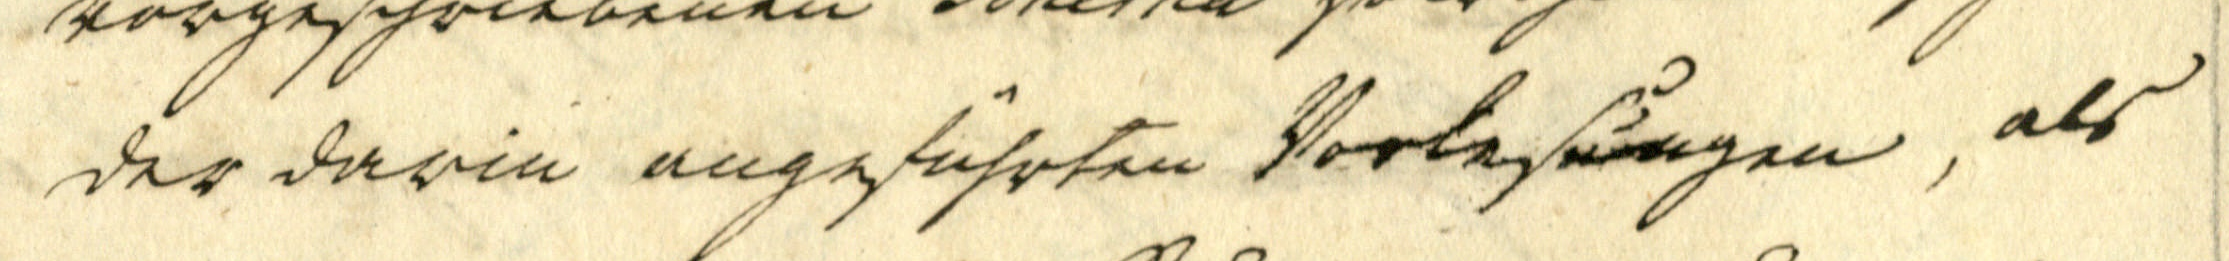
der darin angeführten Vorlesungen, als
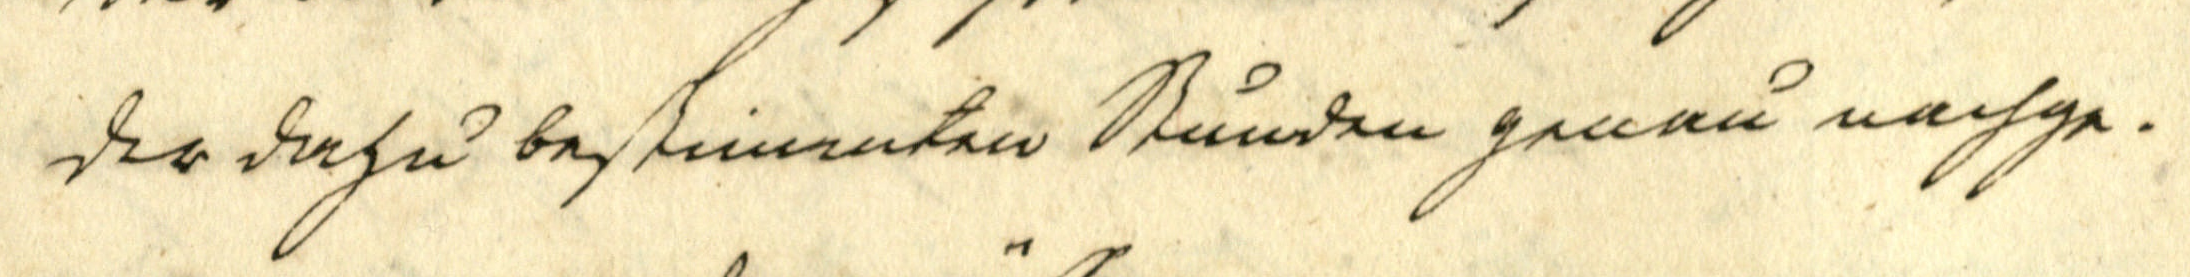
der dazu bestimmten Stunden genau nachge¬
